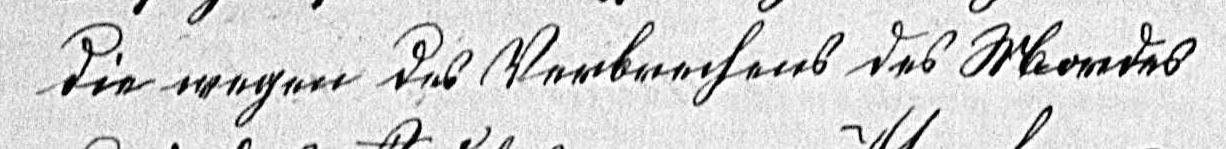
die wegen des Verbrechens des Mordes
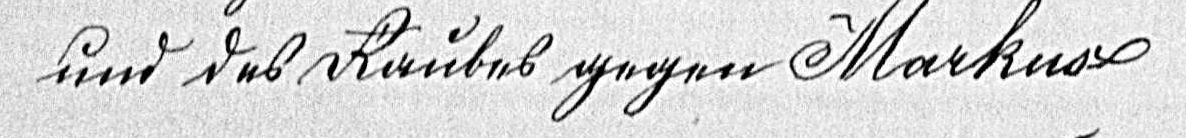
und des Raubes gegen Markus
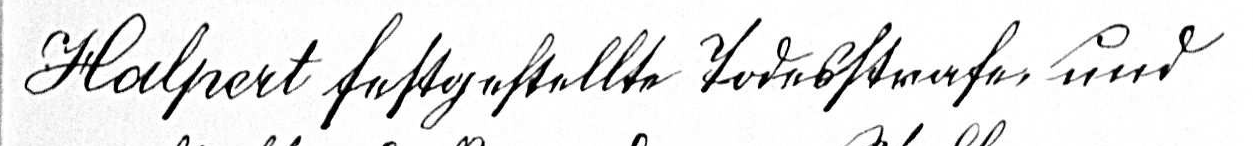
Halpert festgestellte Todesstrafe und
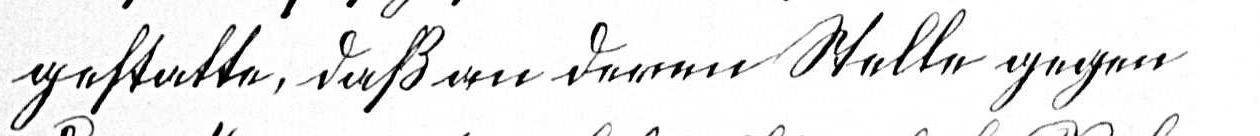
gestatte, daß an deren Stelle gegen
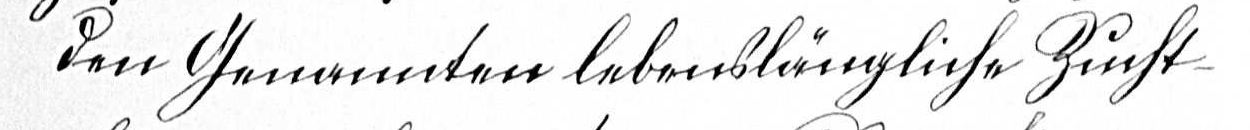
den Genannten lebenslängliche Zucht¬
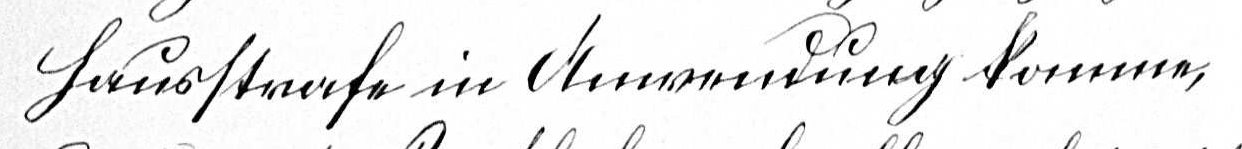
hausstrafe in Anwendung komme,
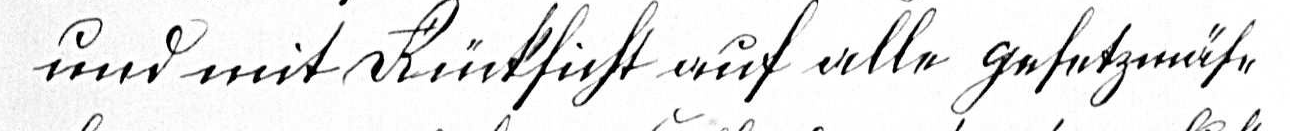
und mit Rücksicht auf alle gesetzmäs¬
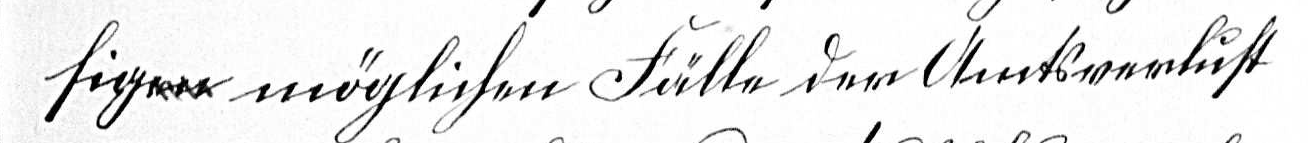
sig möglichen Fälle der Amtsverlust
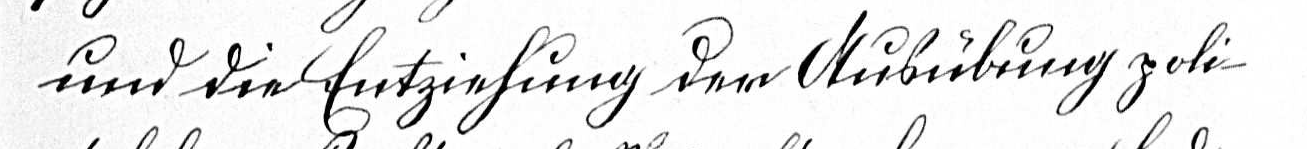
und die Entziehung der Ausübung poli¬
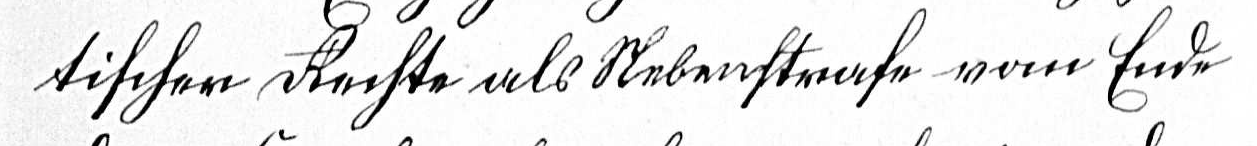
tischer Rechte als Nebenstrafe vom Ende
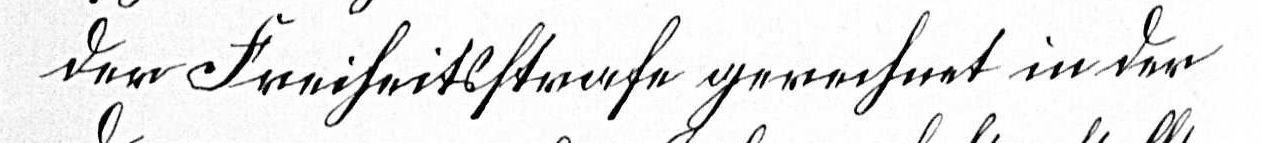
der Freiheitsstrafe gerechnet in der
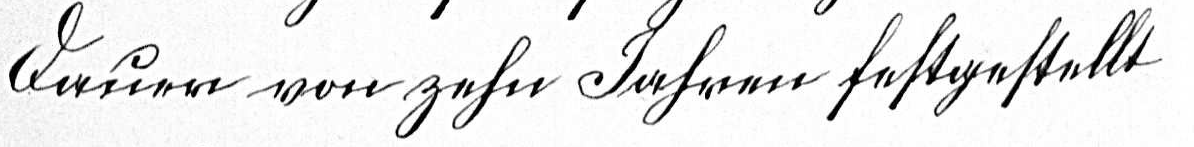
Dauer von zehn Jahren festgestellt
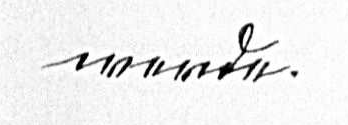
werde.
